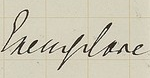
deutsche
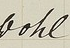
wohl
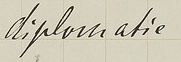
Diplomatie
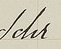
sehr
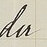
starke
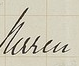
Nachfrage
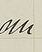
ist. Diese
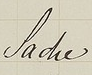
Herren
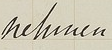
nehmen an
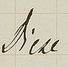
der
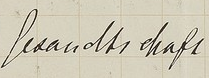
Gesandtschaft
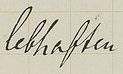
lebhaften
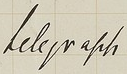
telegraph.
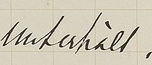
unterhält.
